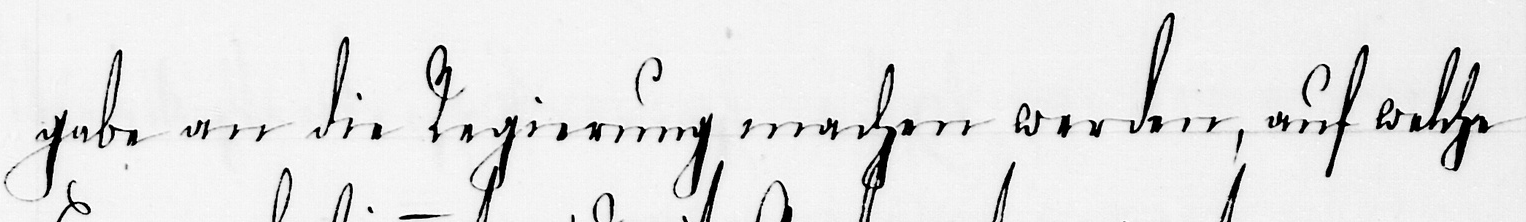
gabe an die Regierung machen werden, auf welche
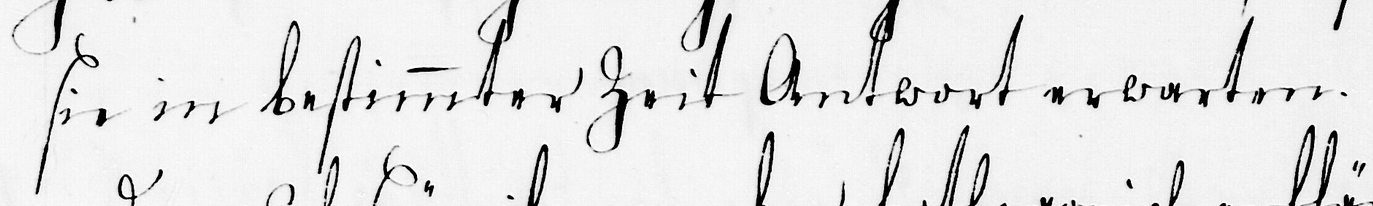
sie in bestimmter Zeit Antwort erwarten.
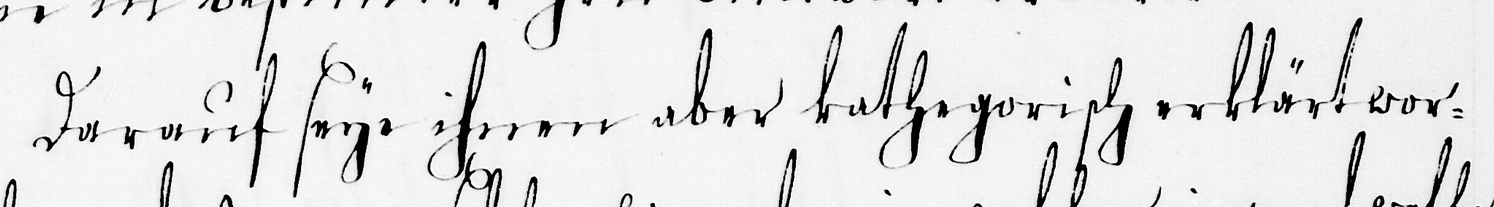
Darauf seye ihnen aber kathegorisch erklärt wor¬
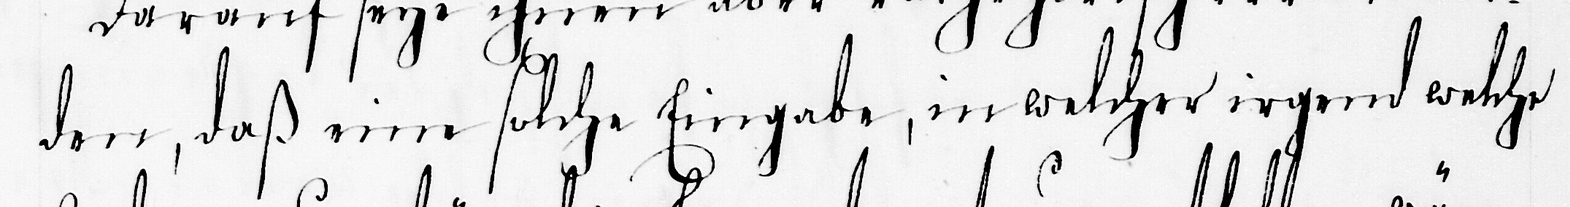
den, daß eine solche Eingabe, in welcher irgend welche
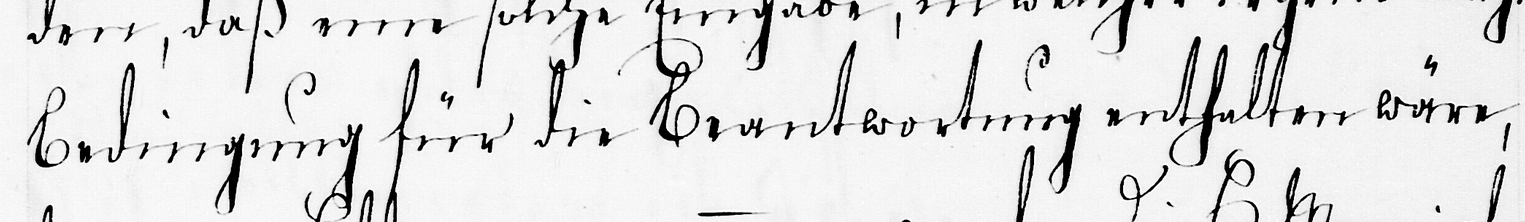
Bedingung für die Beantwortung enthalten wäre,
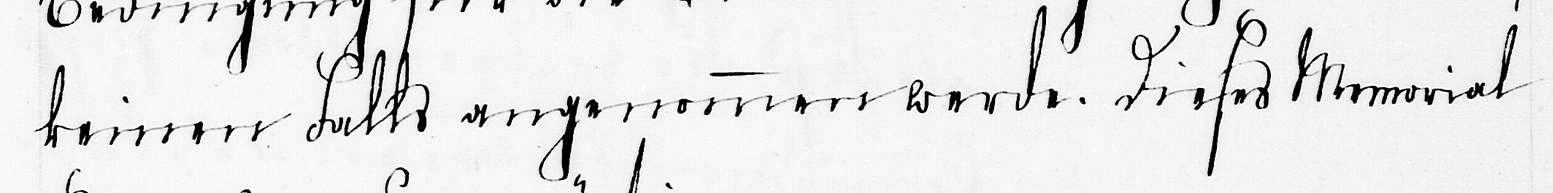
keinen Falls angenommen werde. Dieses Memorial
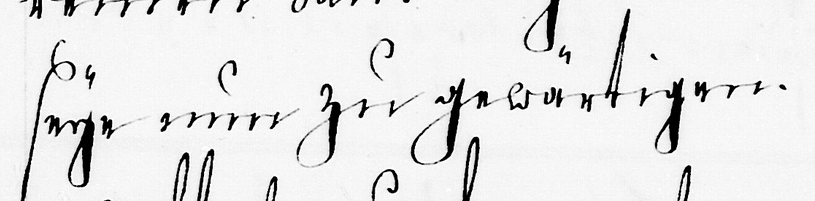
seye nun zu gewärtigen.
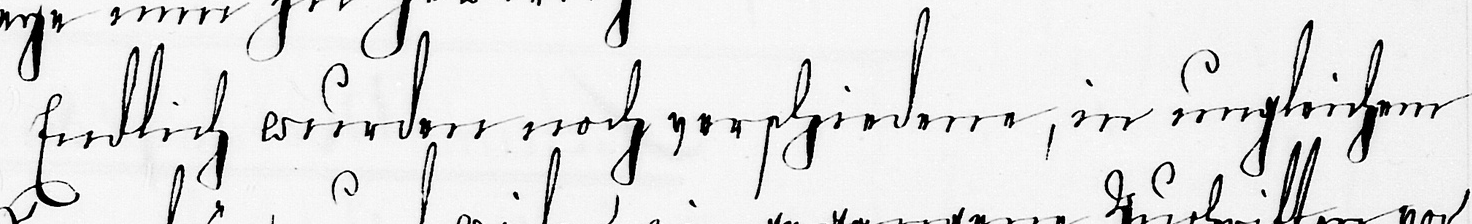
Endlich wurden noch verschiedene, in ungleichem
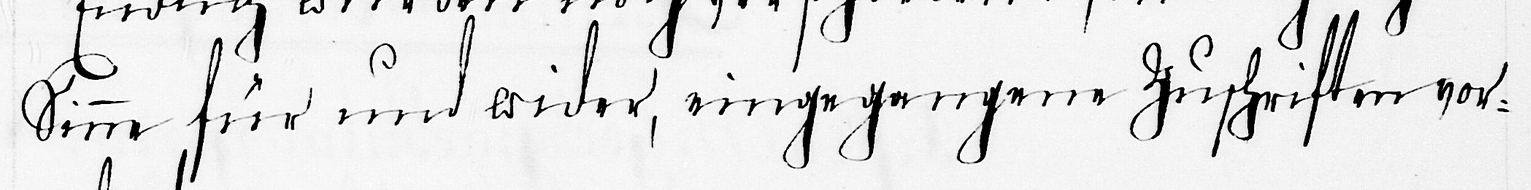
Sinne für und wider, eingegangene Zuschriften vor¬
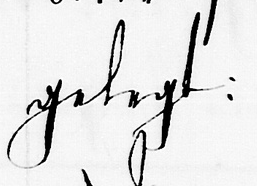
gelegt:
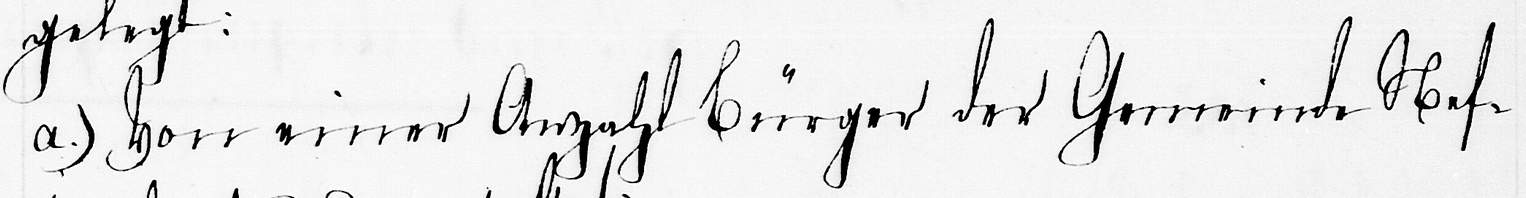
a.) Von einer Anzahl Bürger der Gemeinde Nef¬
